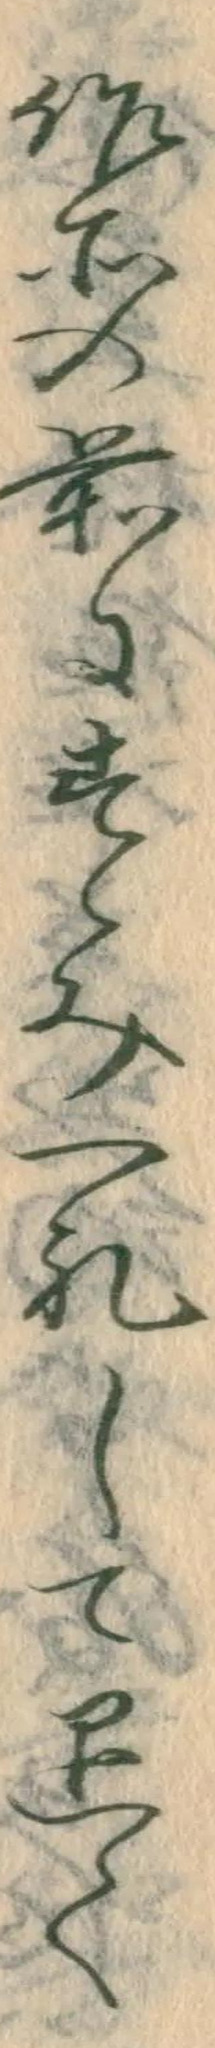作所の前にすゝみ一礼して退く
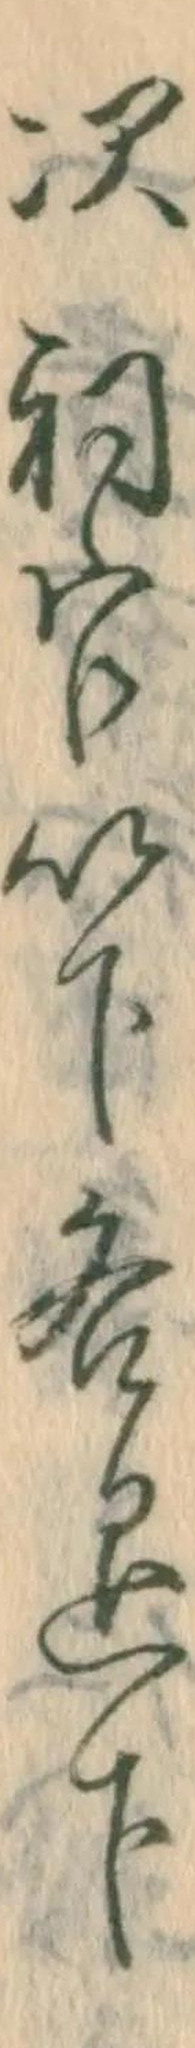次祠官以下各退下
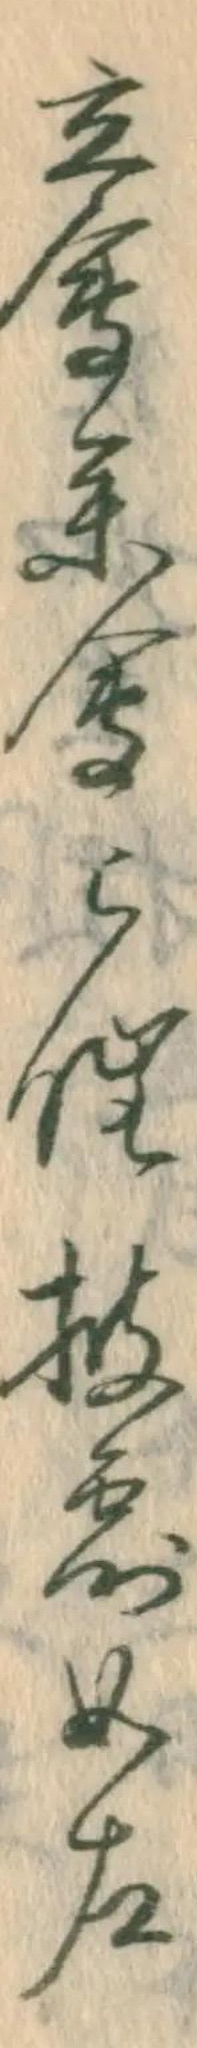一立会参会被催披露如左
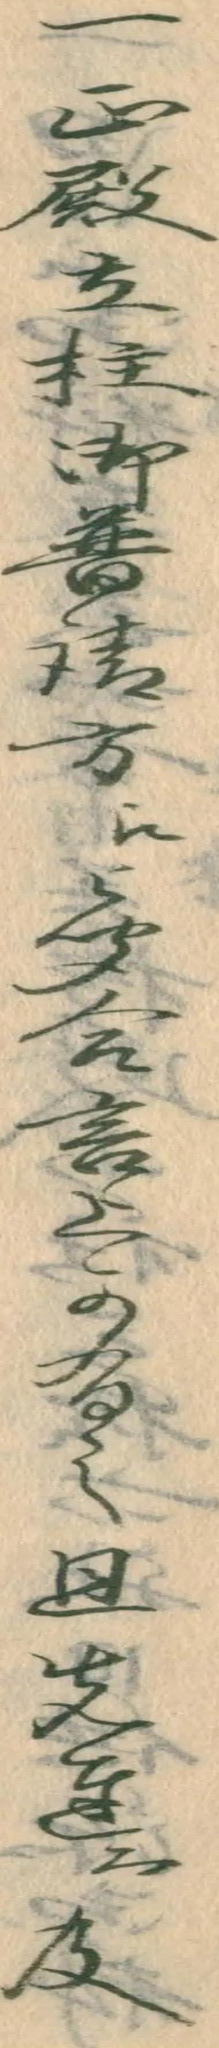一正殿立柱御普請方江被聞合言上可有之且先達而及
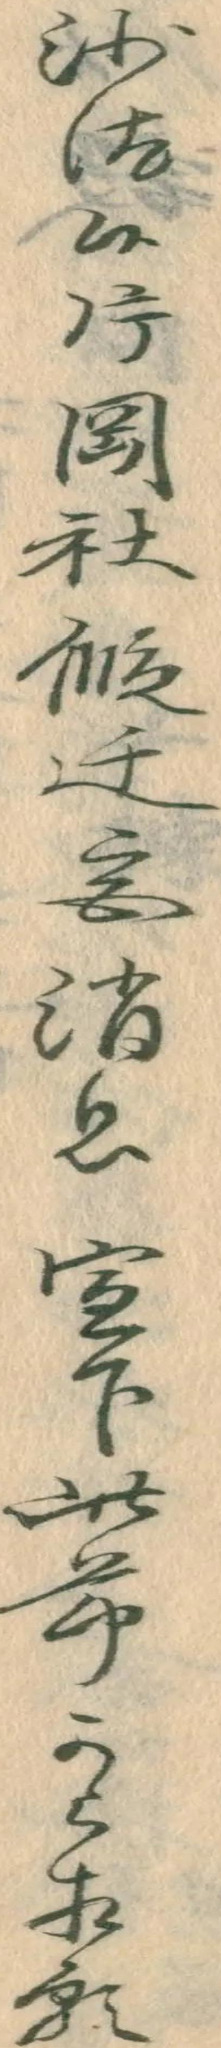沙汰候片岡社仮迁宮消息宣下此節可被相願
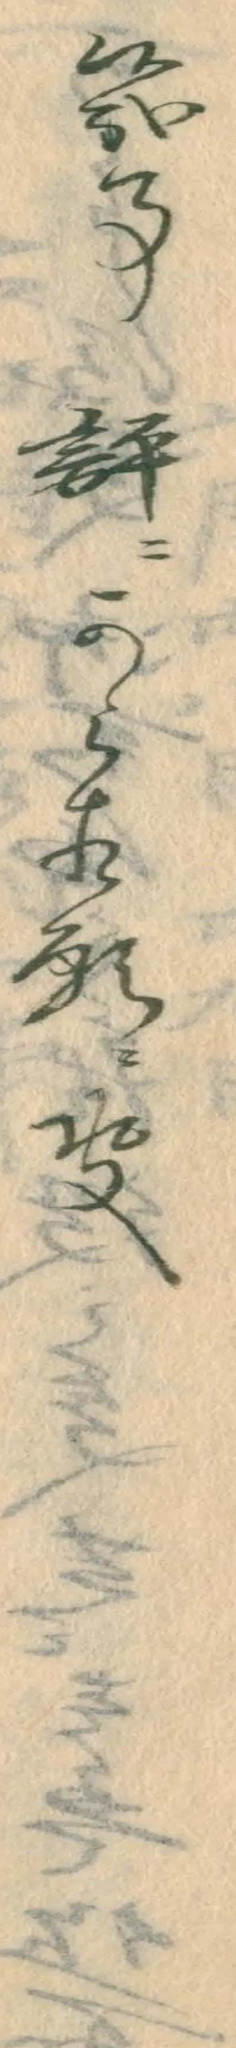候哉事評ニ可被相願ニ決
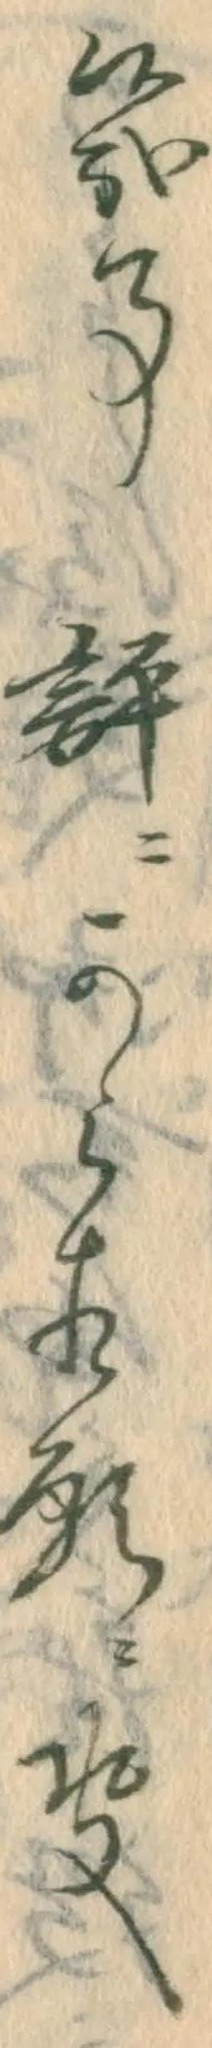候哉事評ニ可被相願ニ決
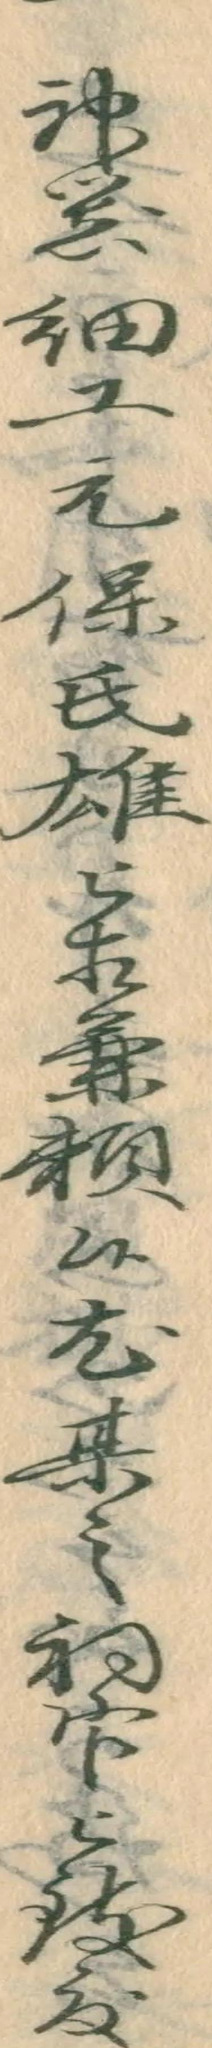一神器細工元保氏雄被相兼頼候尤某之祠官被致度
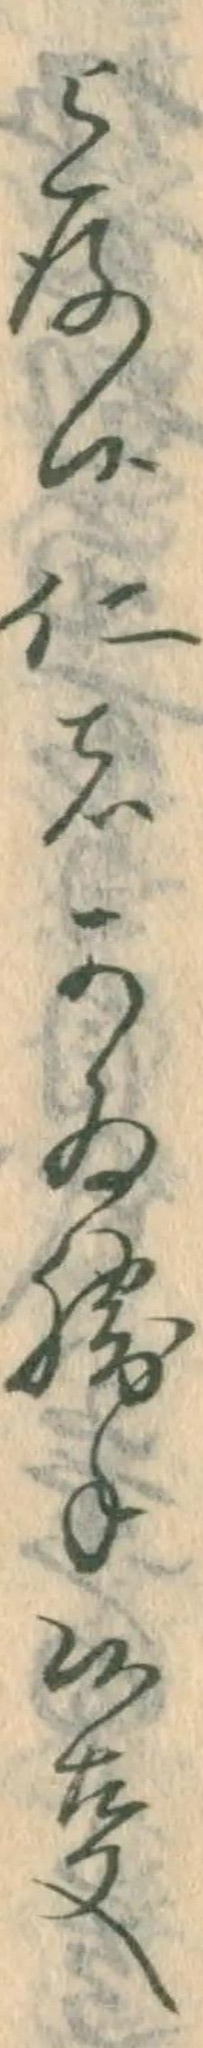被存候仁は可為勝手候事
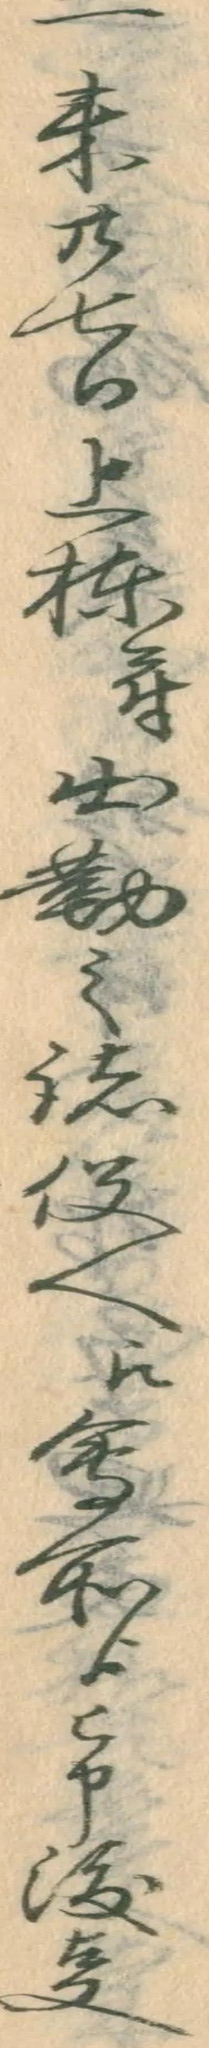一来廿七日上棟ニ付出勤之諸役人江会所ゟ被申渡事

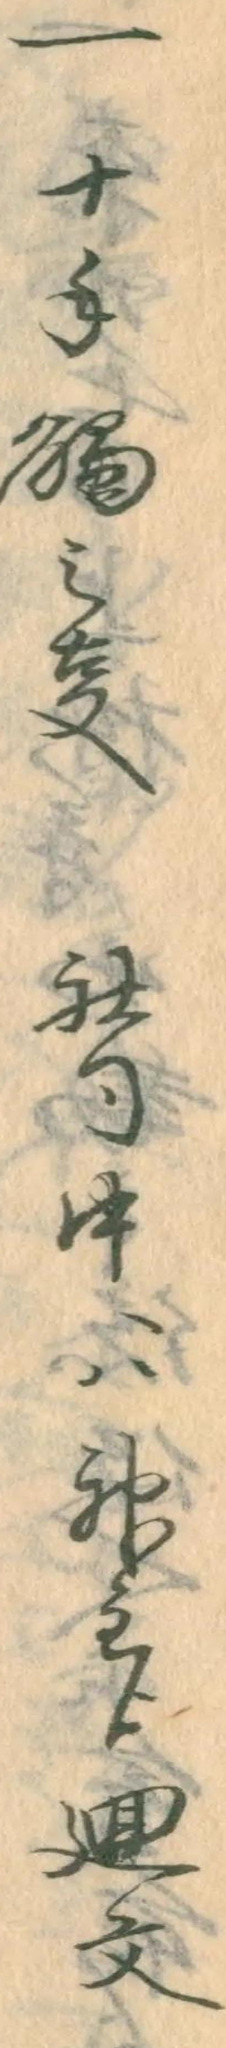一十手触之事社司中へハ神主ゟ廻文
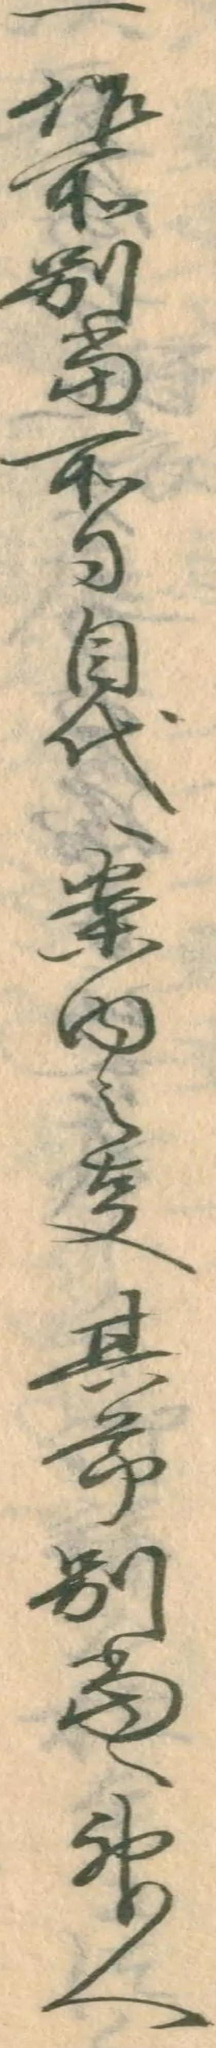一作所別当所司目代へ案内之事其節別当へ神人
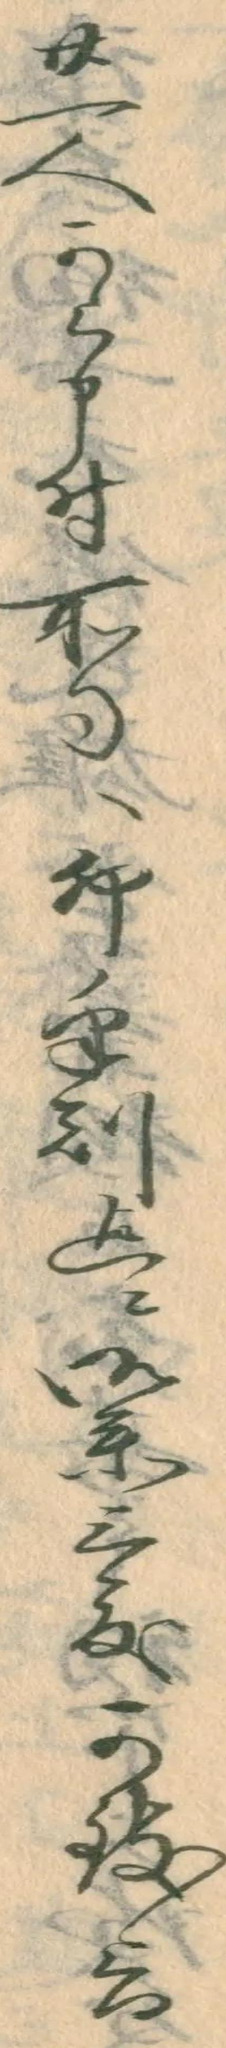廿一人可被申付所司へ卯ノ半刻迄ニ御参三度可致旨
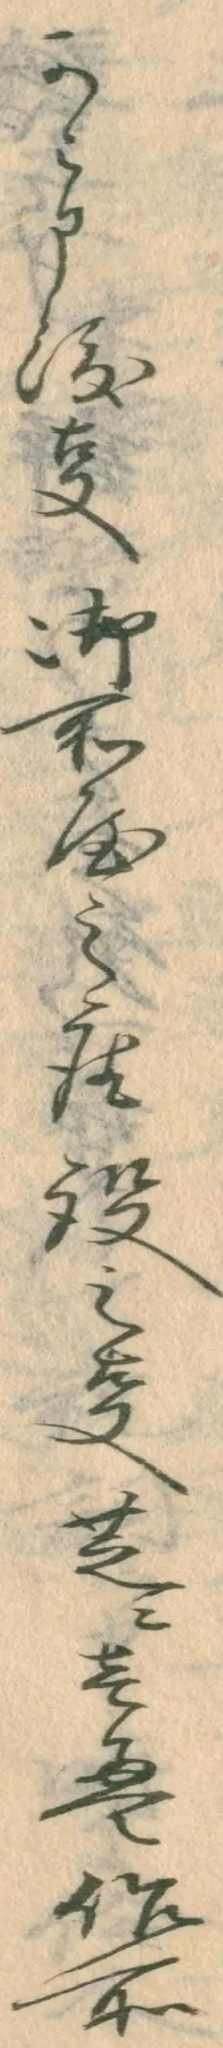可被申渡事御所屋之座設之事芝ニ壱畳作所
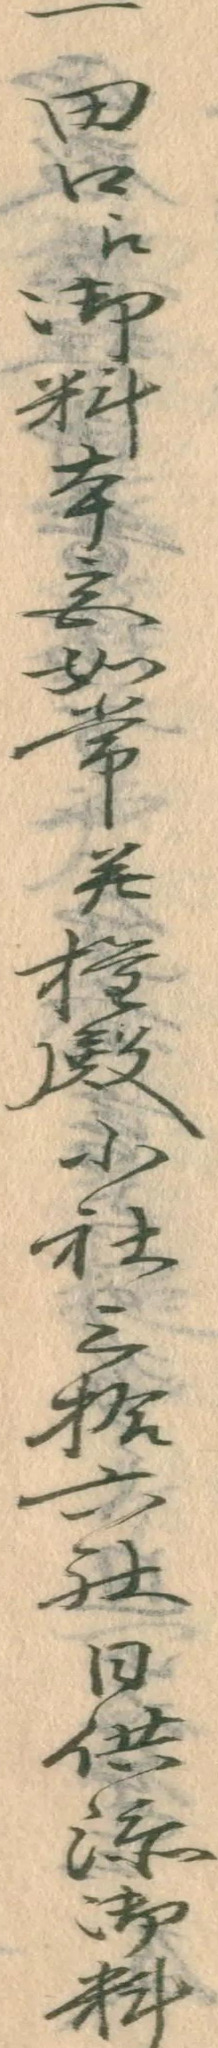一田口江御料本宮如常并権殿小社三拾六社日供添御料
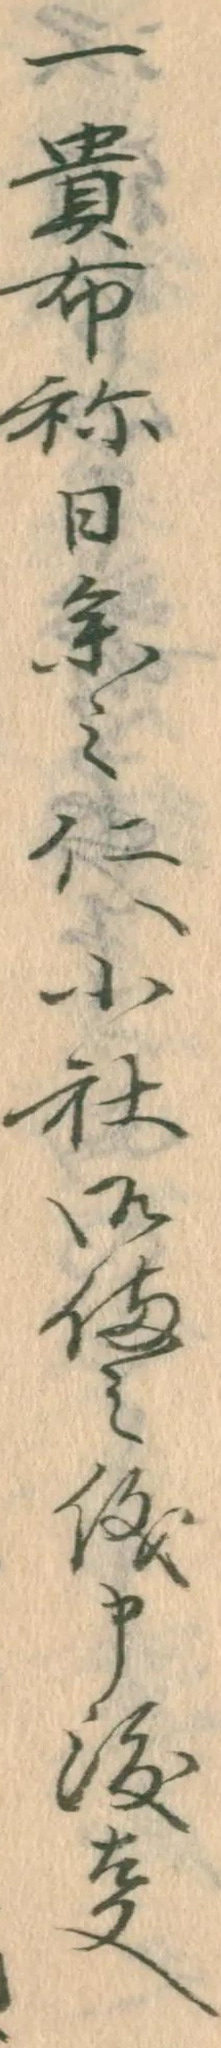一貴布称日参之仁へ小社御備之儀申渡事
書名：賀茂社記録. 第17冊
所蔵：国立国会図書館 National Diet Library, JAPAN
